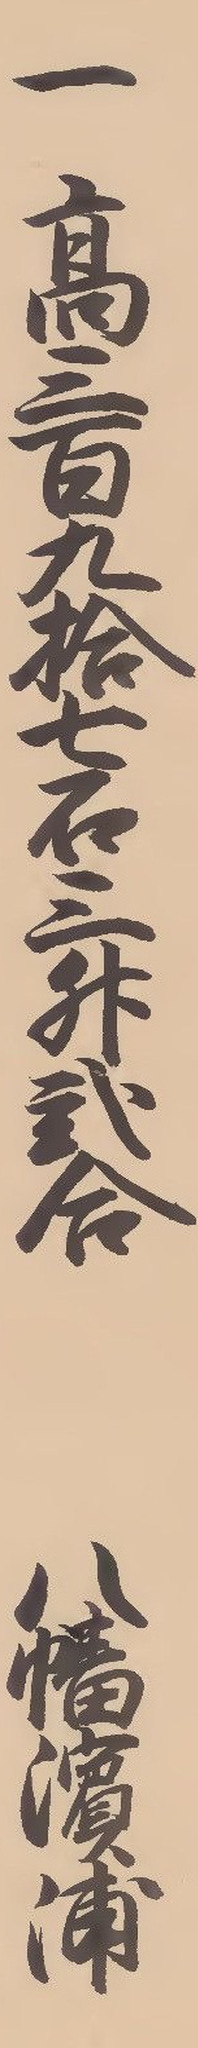一高三百九拾七石三升弐合八幡浜浦
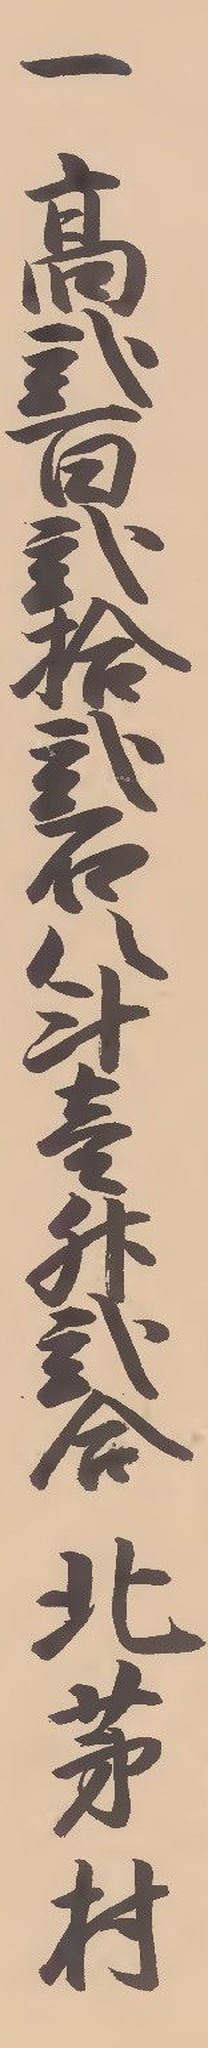一高弐百弐拾弐石八斗壱升弐合北茅村

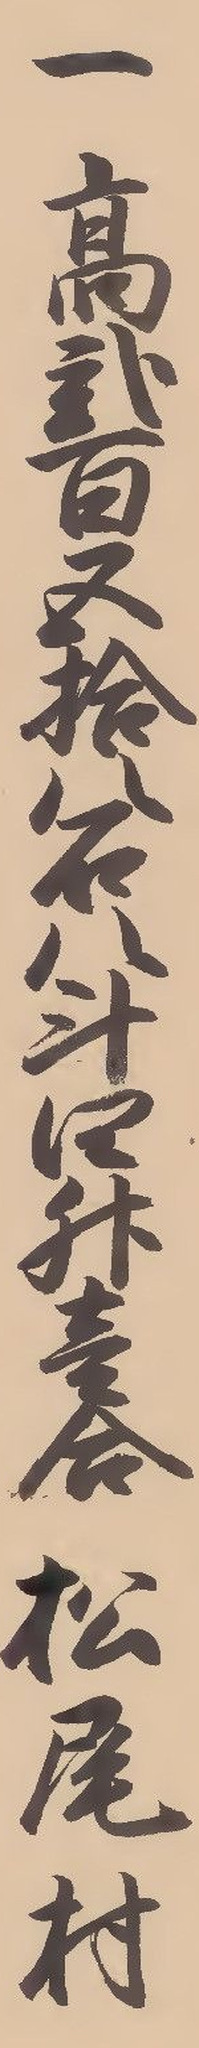一高弐百五拾八石八斗四升壱合松尾村
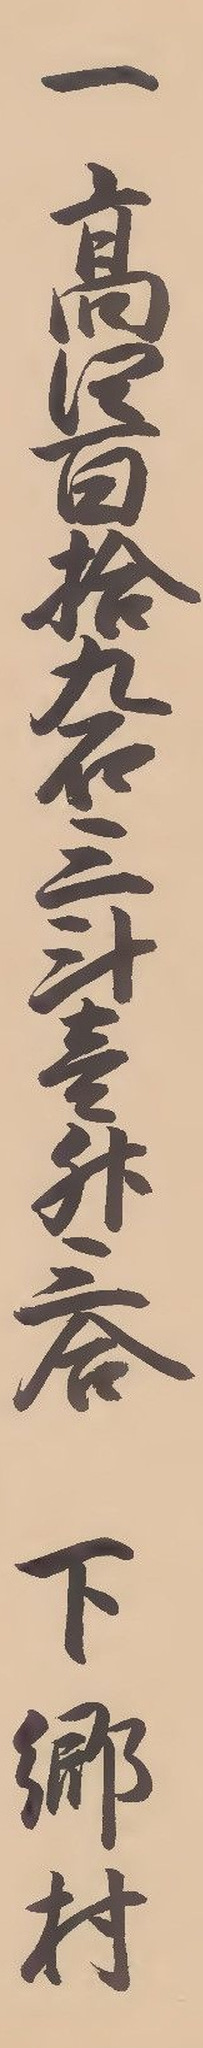一高四百拾九石三斗壱升三合下郷村
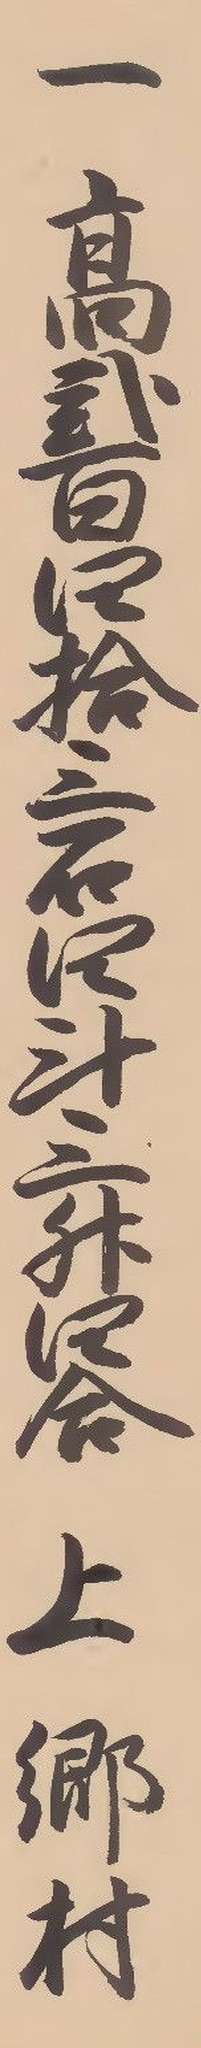一高弐百四拾三石四斗三升四合上郷村
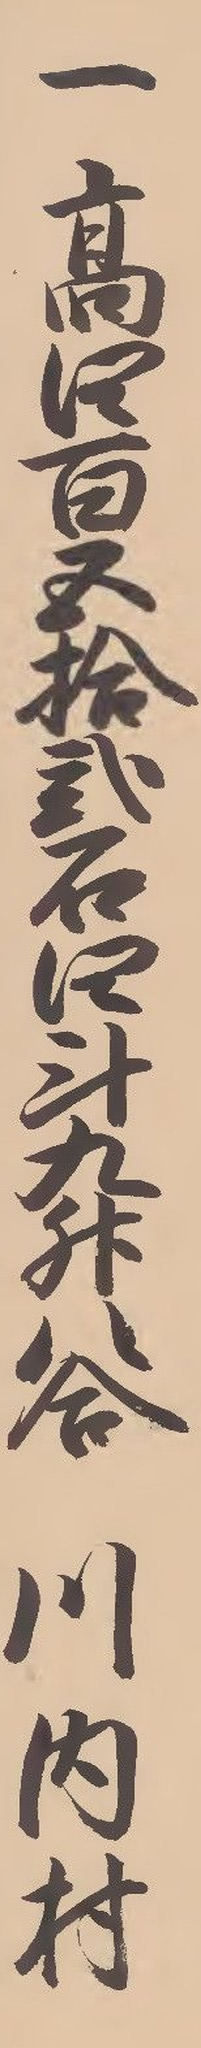一高四百五拾弐石四斗九升八合川内村
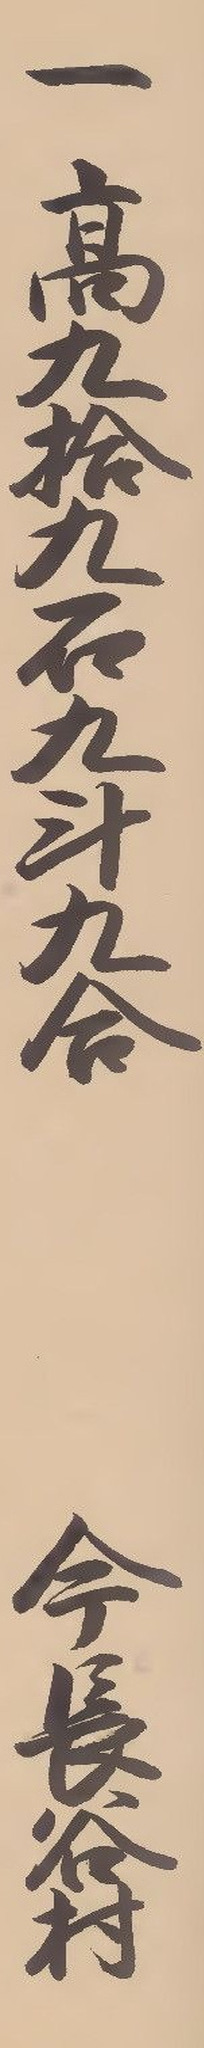一高九拾九石九斗九合今長谷村
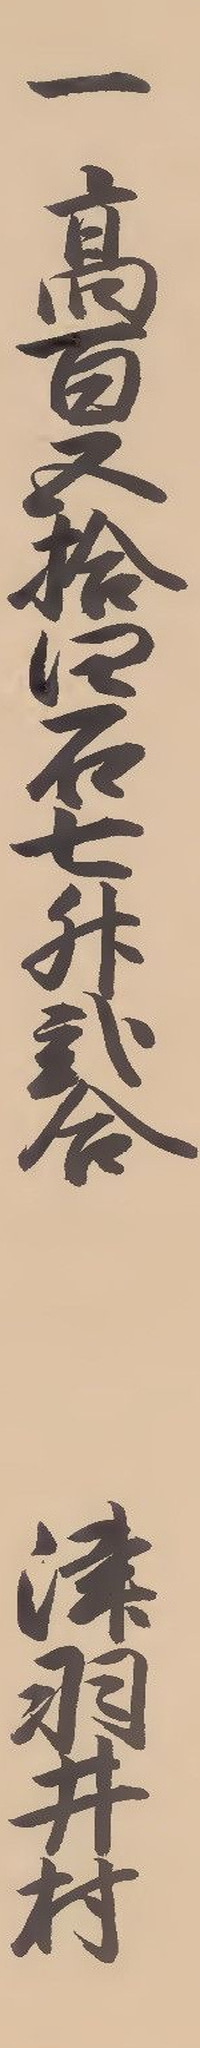一高百五拾四石七升弐合津羽井村
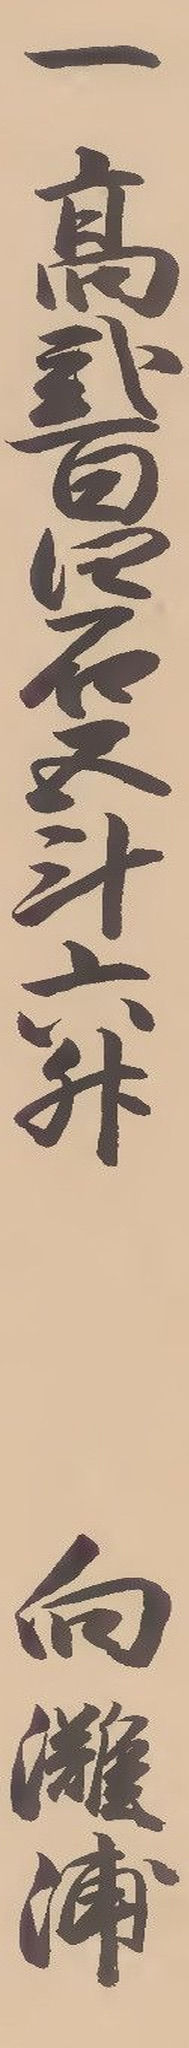一高弐百四石五斗六升向灘浦

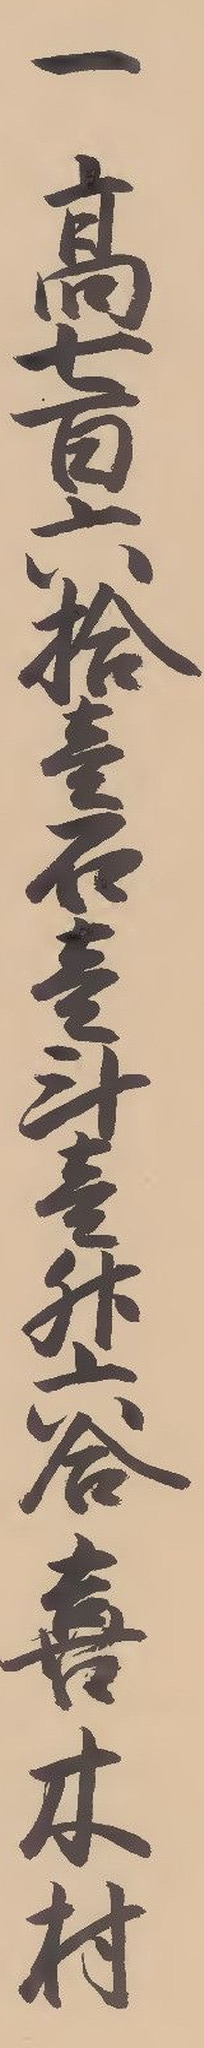一高七百六拾壱石壱斗壱升六合喜木村
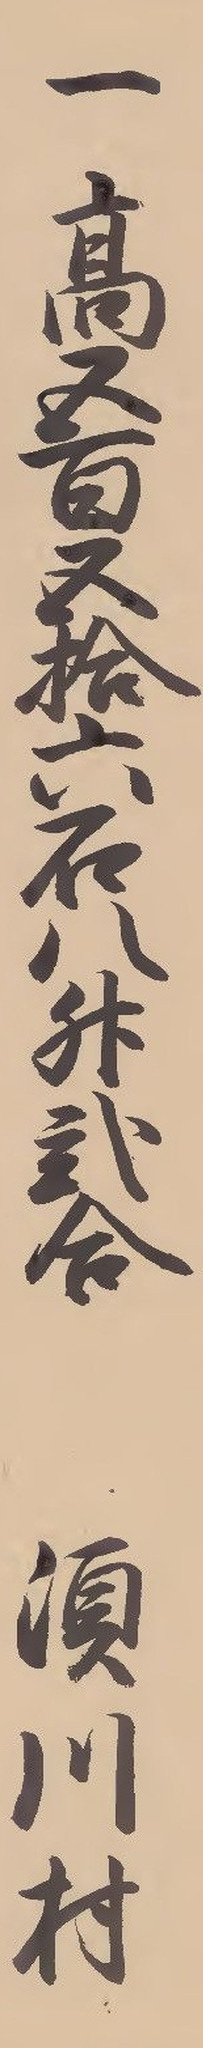一高五百五拾六石八升弐合須川村
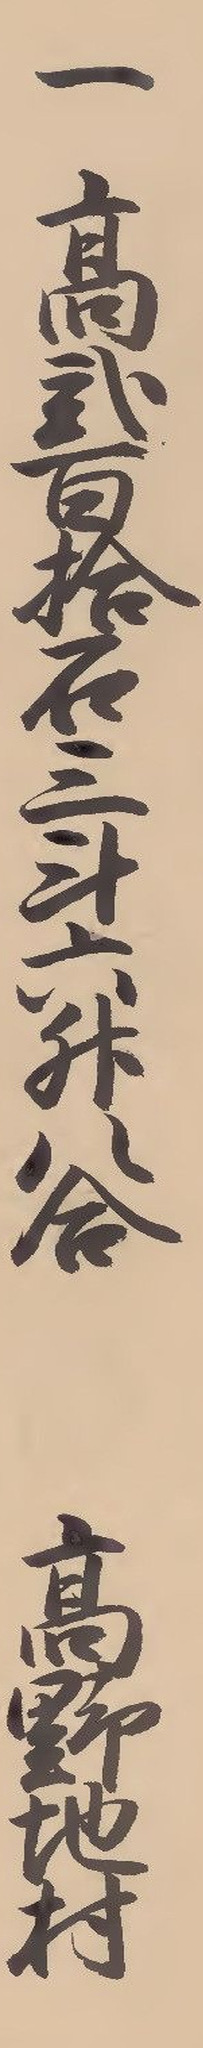一高弐百拾石三斗六升八合高野地村
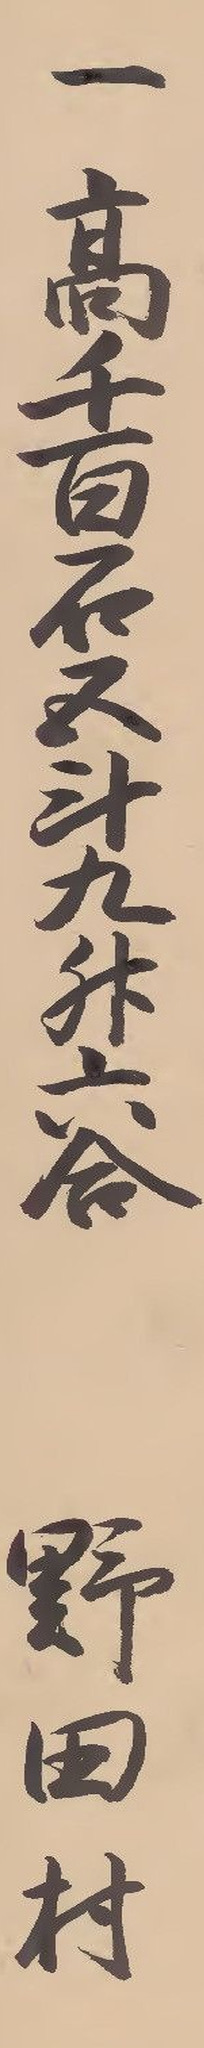一高千百石五斗九升六合野田村
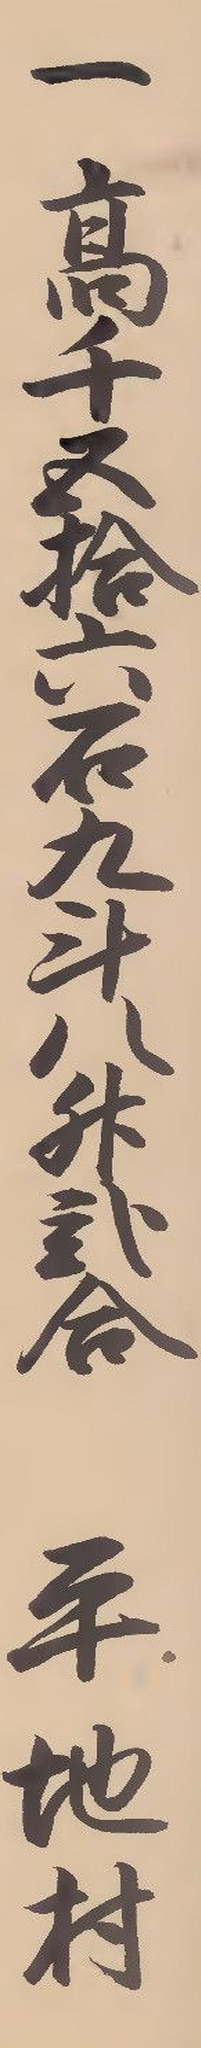一高千五拾六石九斗八升弐合平地村
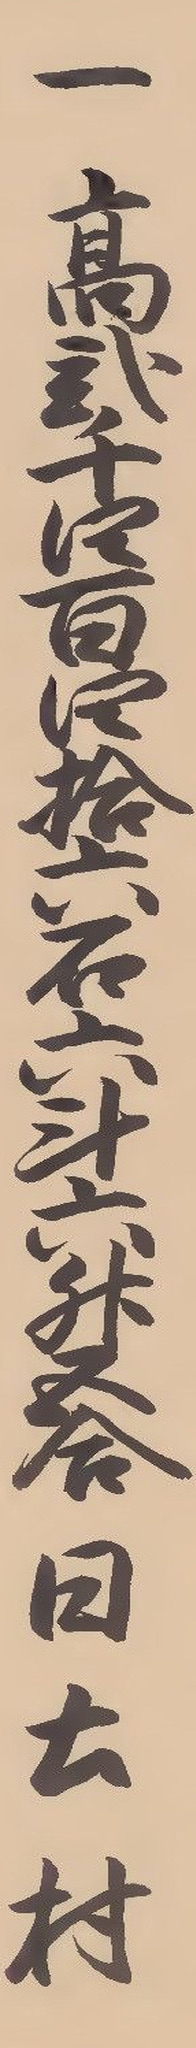一高弐千四百四拾六石六斗六升五合日土村
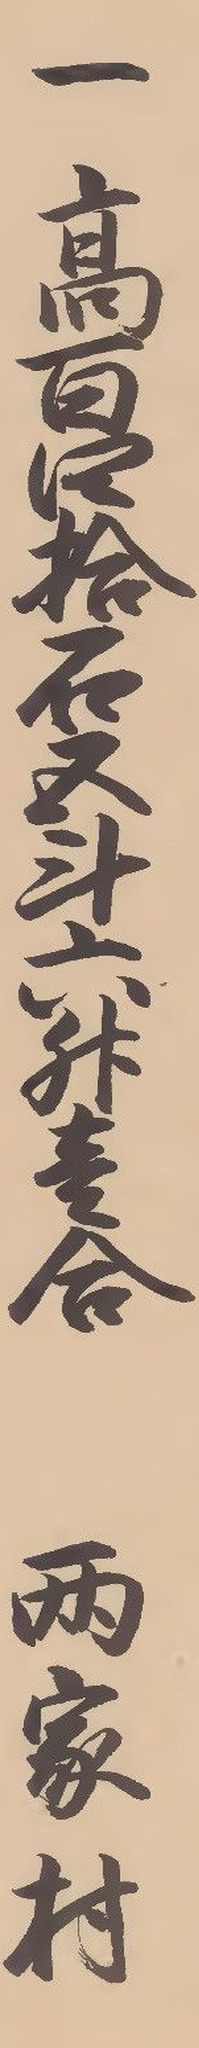一高百四拾石五斗六升壱合両家村
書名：伊予国郷帳
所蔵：国立公文書館 National Archives of Japan
